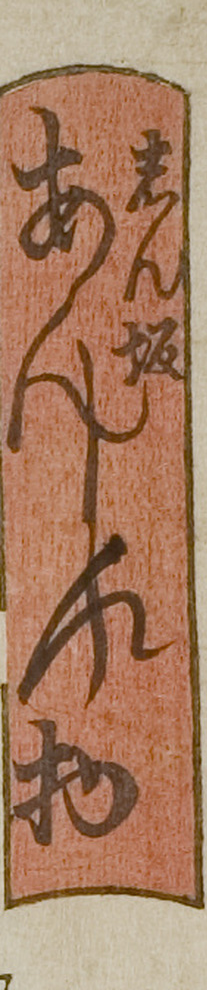あんしん物
